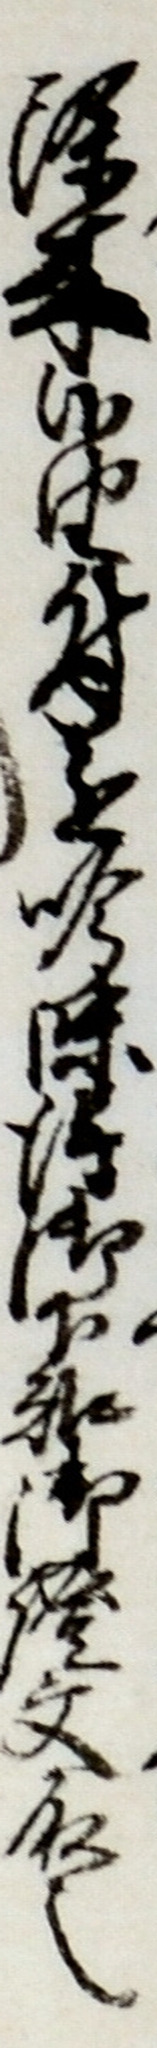除来候由ニ付進吟味得御下知御証文取之
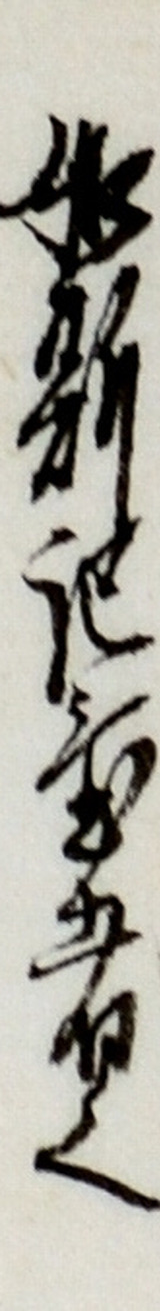如斯記置者也
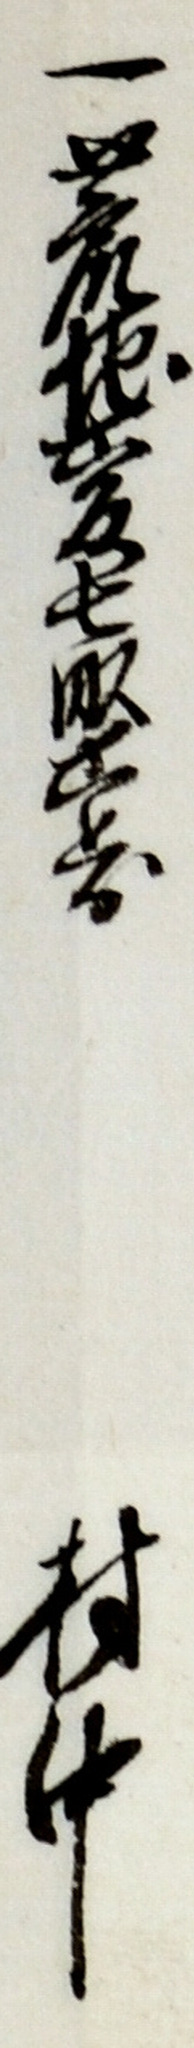一荒地六反七畝六歩村中
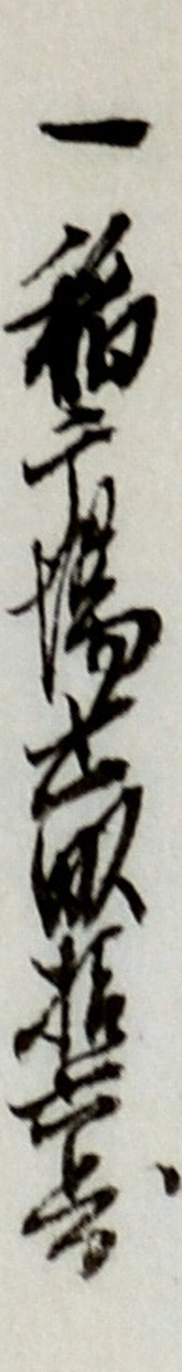一稲干場六畝拾六歩
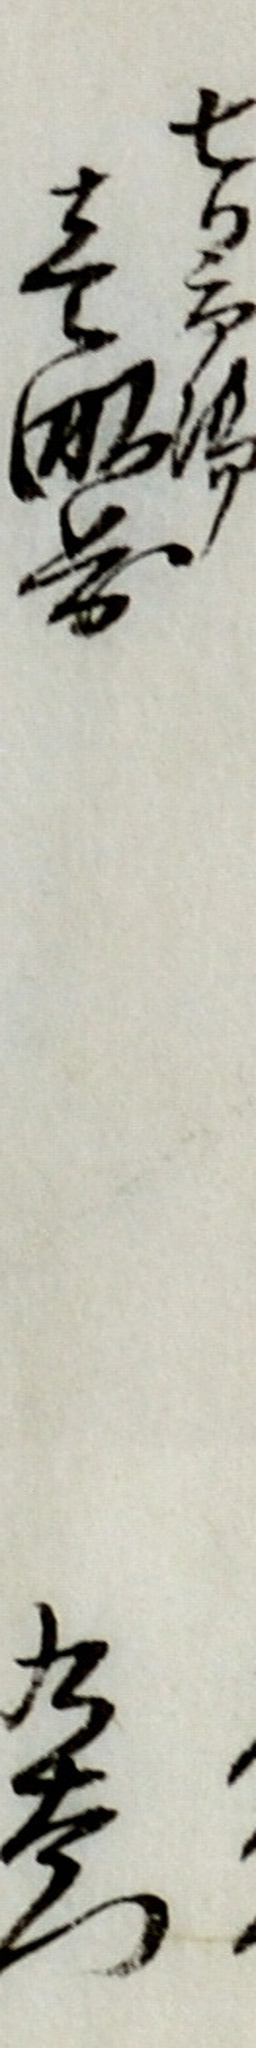壱畝歩九右衛門
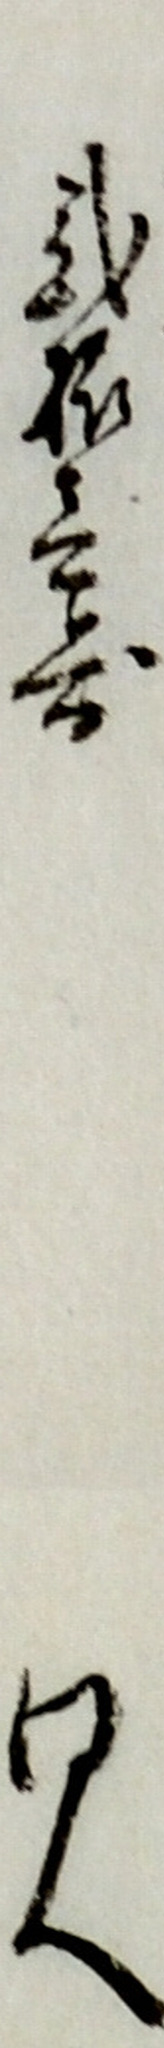弐拾壱歩同人
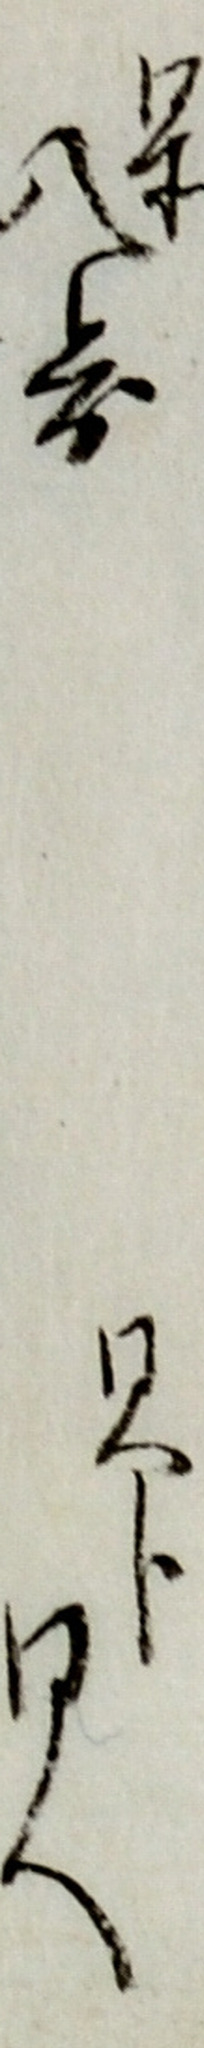八歩同人
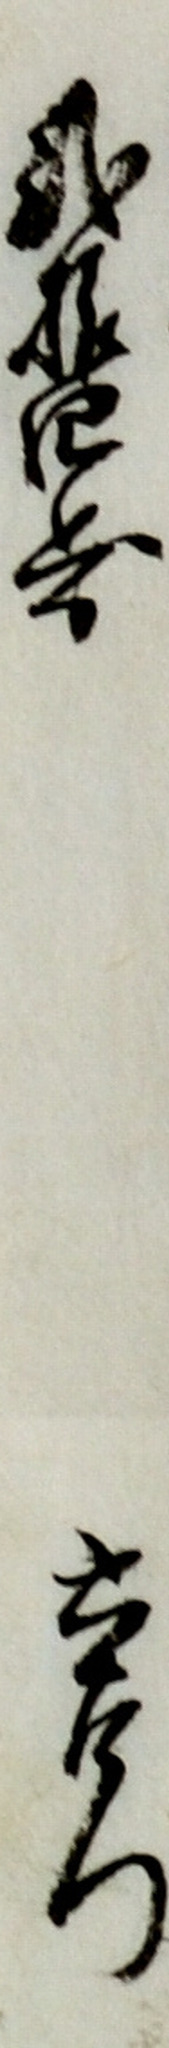弐拾四歩六右衛門

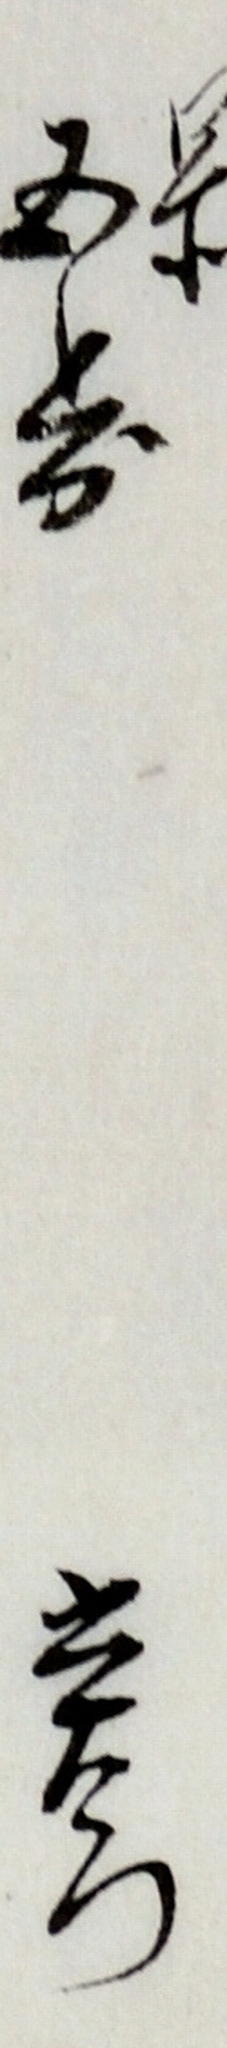五歩六右衛門
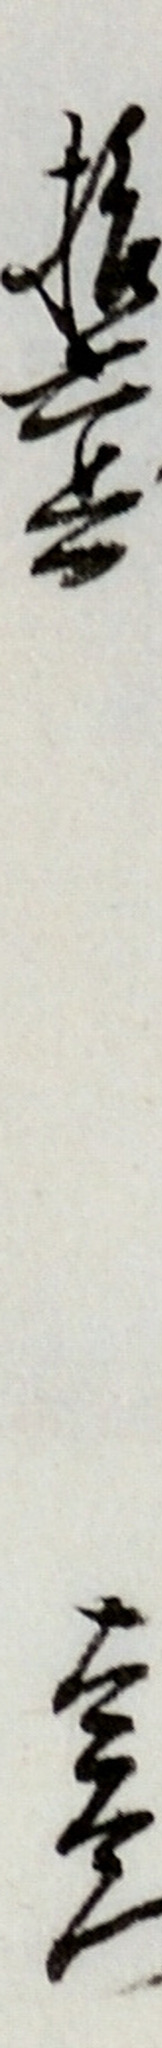五歩六右衛門
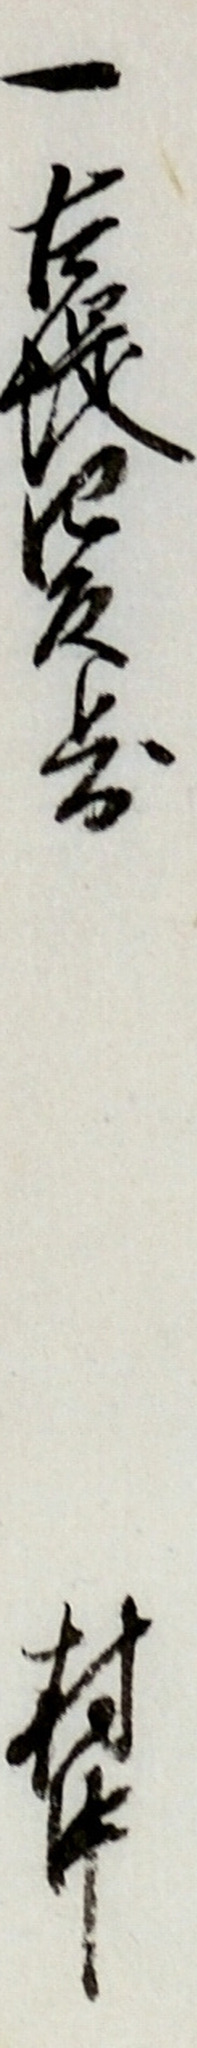一古堤四反歩村中
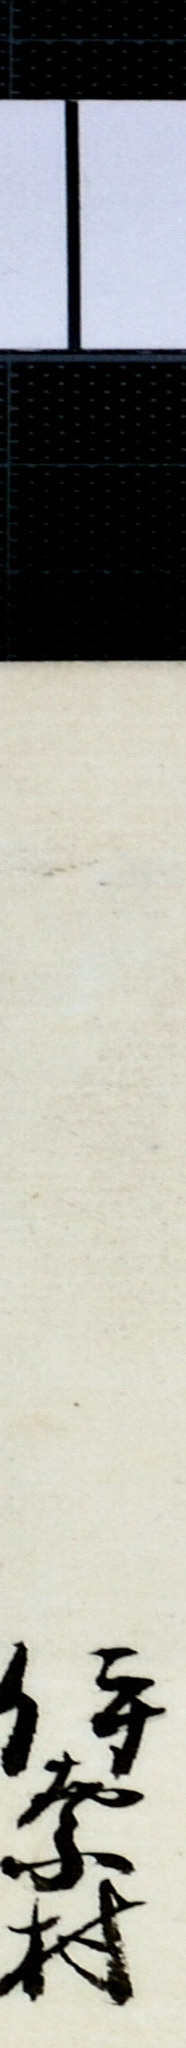伊奈村
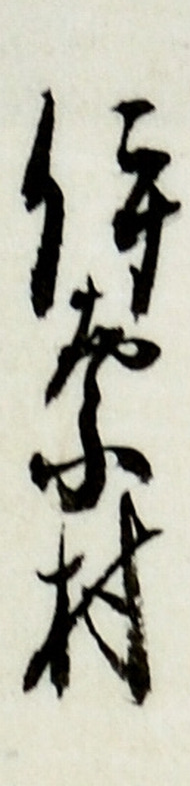伊奈村
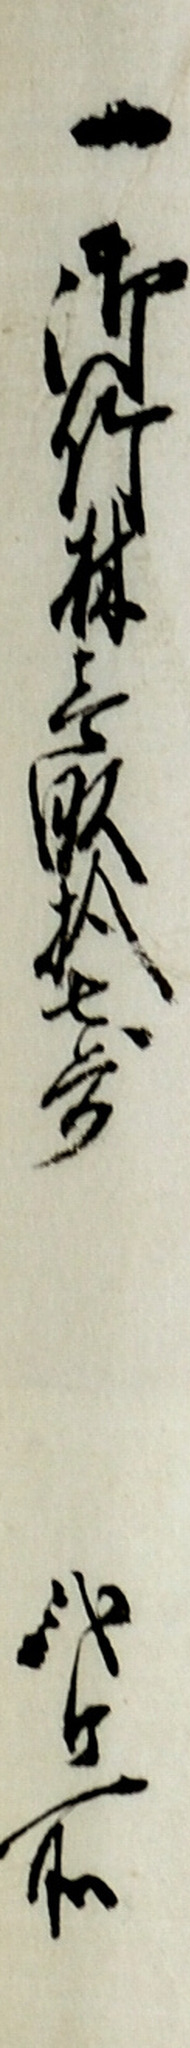一御竹林壱畝拾七歩弐ケ所
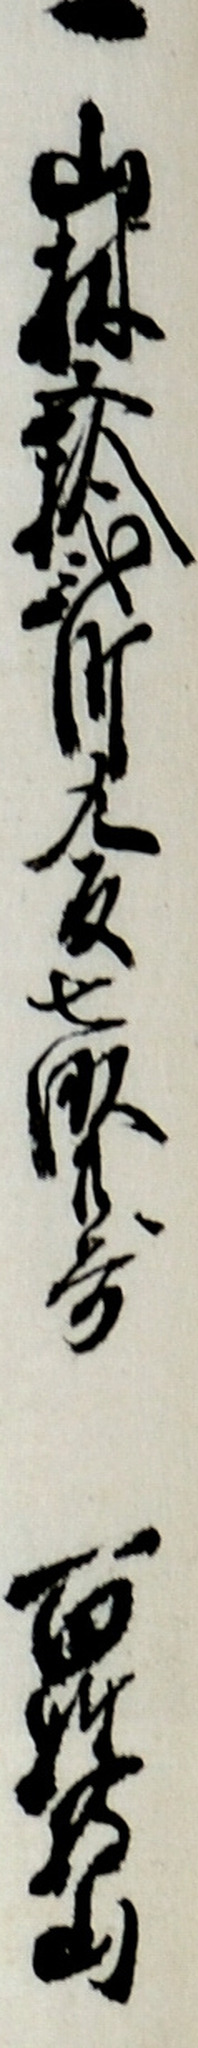一山林五拾弐町九反七畝廿歩百姓持山
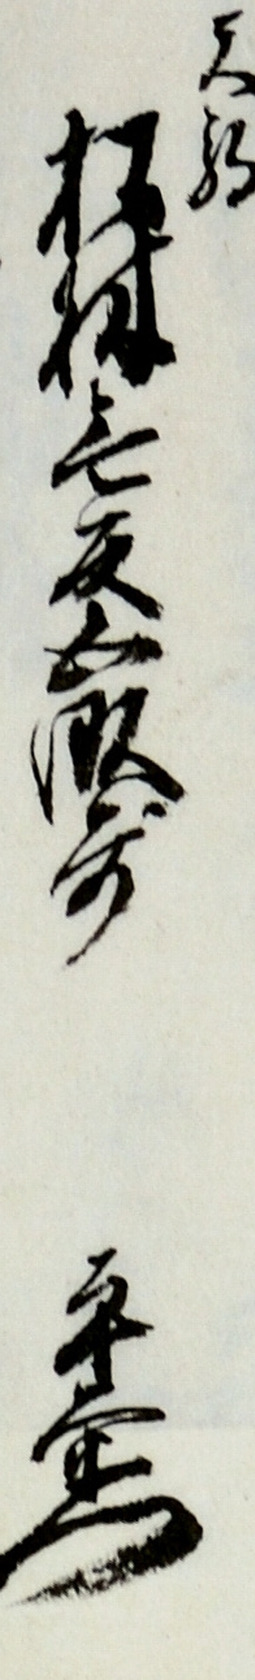松林壱反五畝歩平右衛門
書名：御領分中山林社地手控
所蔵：伊那市立高遠町図書館・合同会社AMANE
